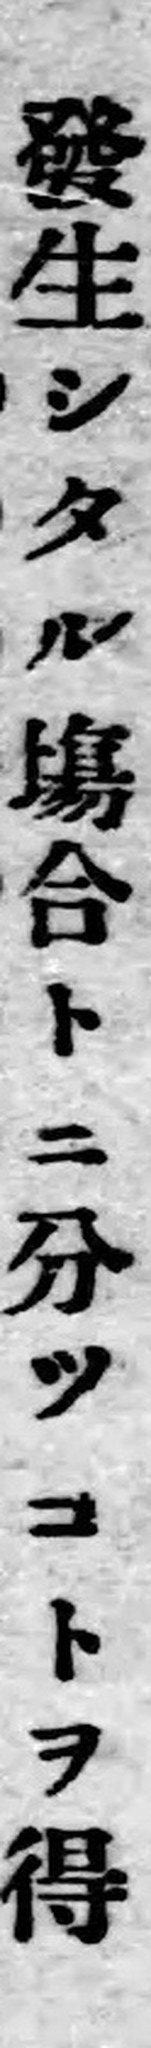發生シタル塲合トニ分ツコトヲ得

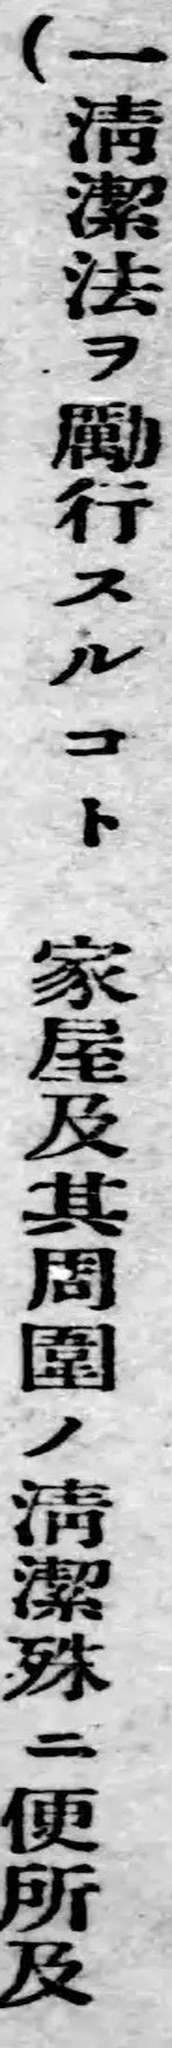(一)淸潔法ヲ勵行スルコト家屋及其周圍ノ淸潔殊ニ便所及
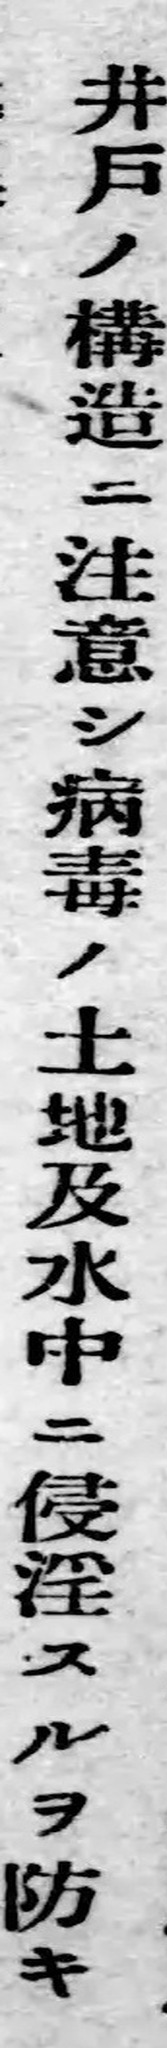井戸ノ構造ニ注意シ病毒ノ土地及水中ニ侵淫スルヲ防キ
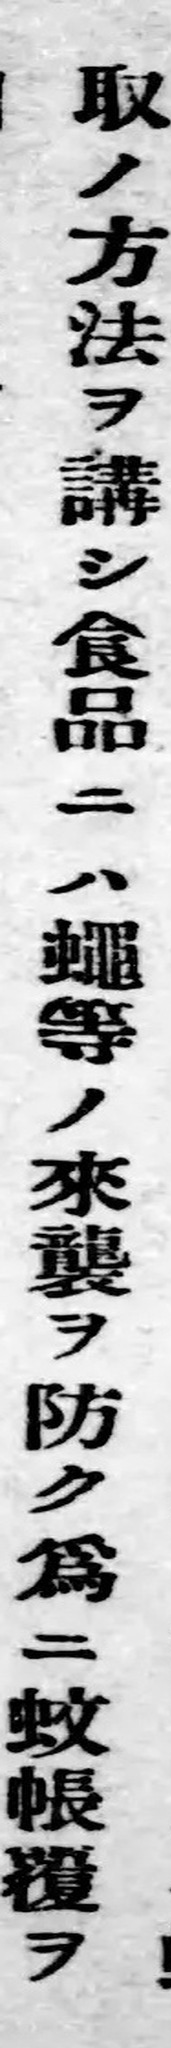取ノ方法ヲ講シ食品ニハ蠅等ノ來襲ヲ防ク爲ニ蚊帳覆ヲ
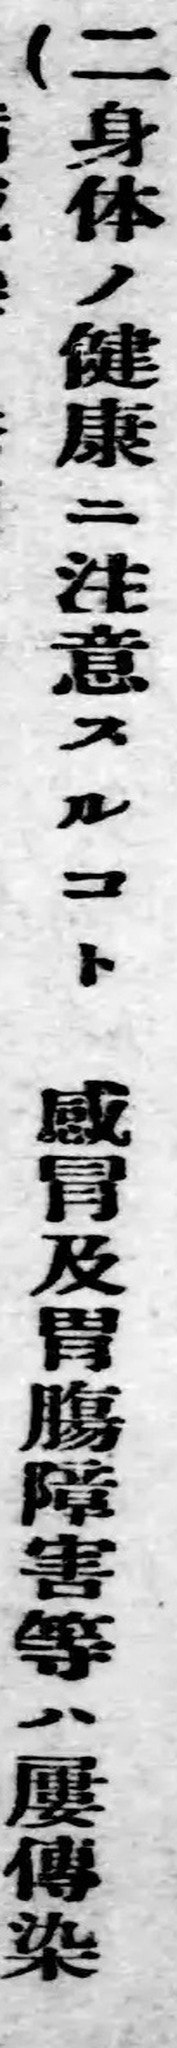(二)身体ノ健康ニ注意スルコト感冒及胃膓障害等ハ屢傅染
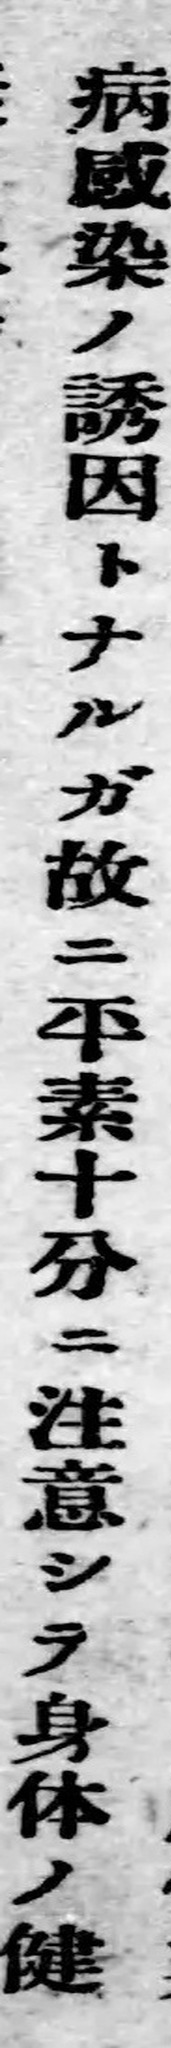病感染ノ誘因トナルガ故ニ平素十分ニ注意シテ身体ノ健
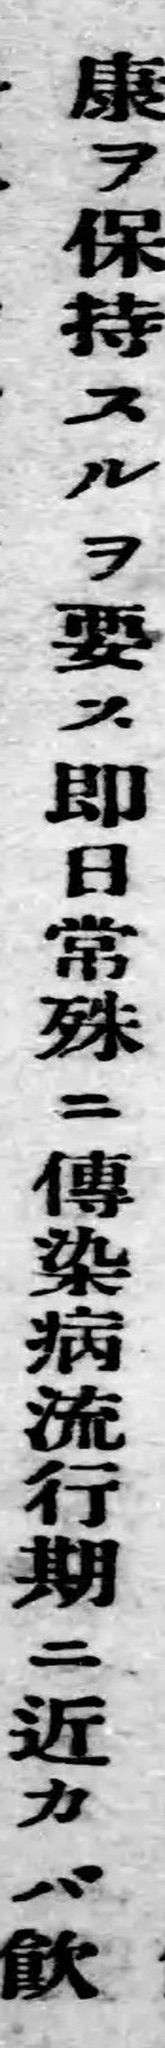康ヲ保持スルヲ要ス即日常殊ニ傅染病流行期ニ近カバ飮
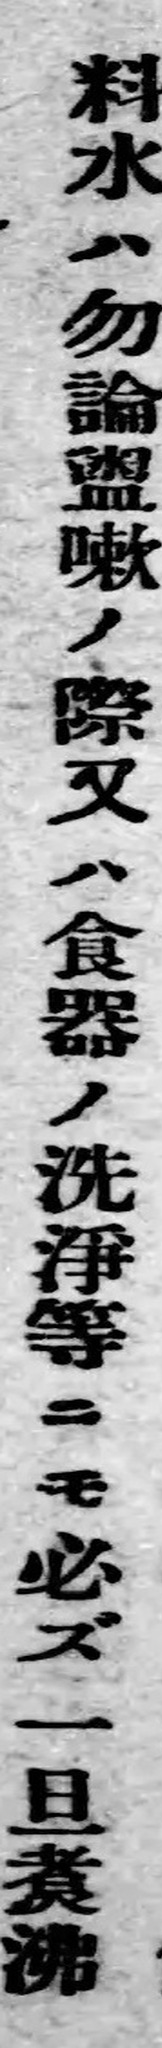料水ハ勿論盥嗽ノ際又ハ食器ノ洗淨等ニモ必ズ一旦煑沸
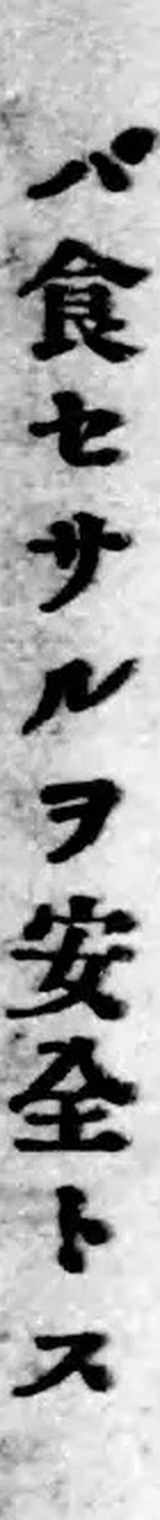バ食セサルヲ安全トス
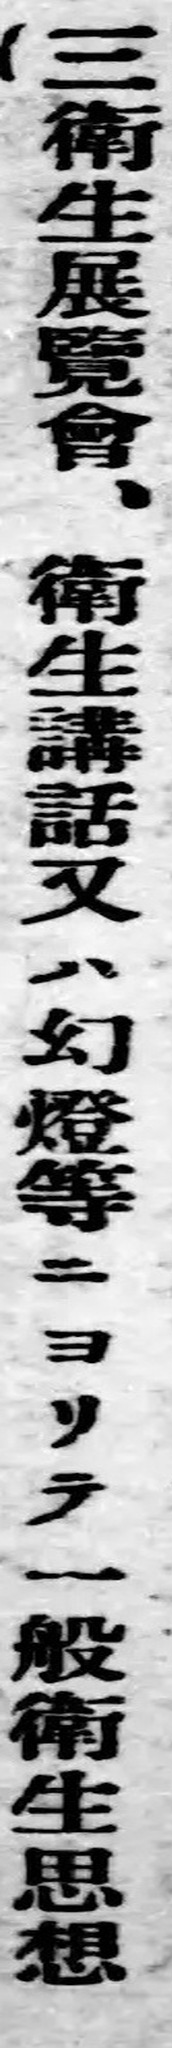(三)衛生展覧會、衛生講和又ハ幻燈等ニヨリテ一般衛生思想
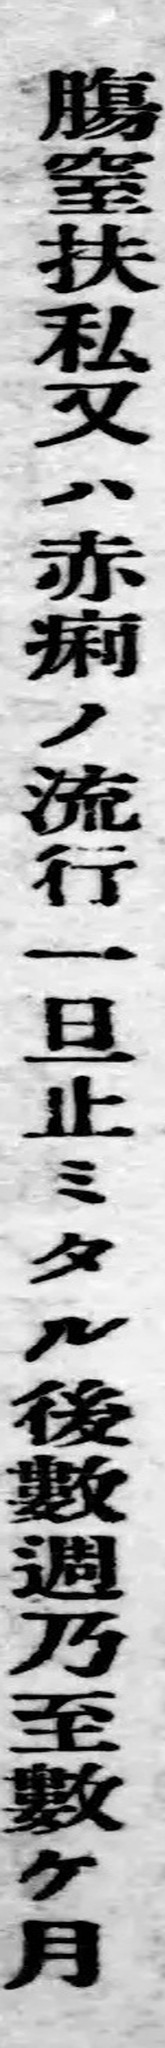膓窒扶私又ハ赤痢ノ流行一旦止ミタル後數週乃至數ヶ月
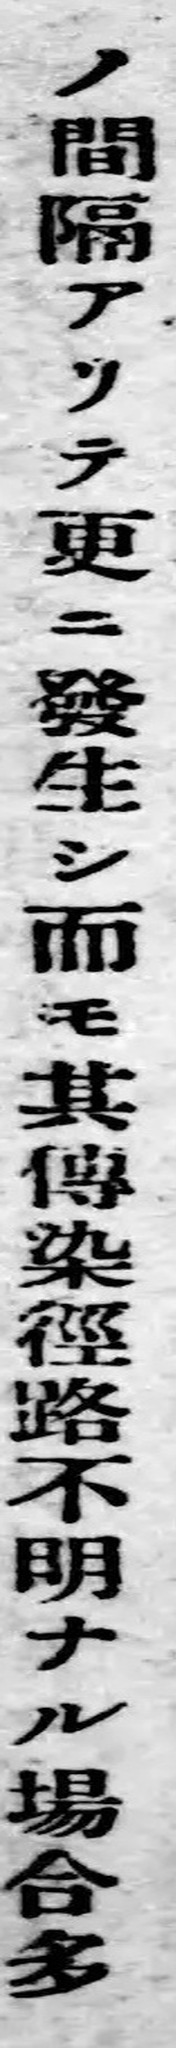ノ間隔アリテ更ニ發生シ而モ其傅染徑路不明ナル場合多
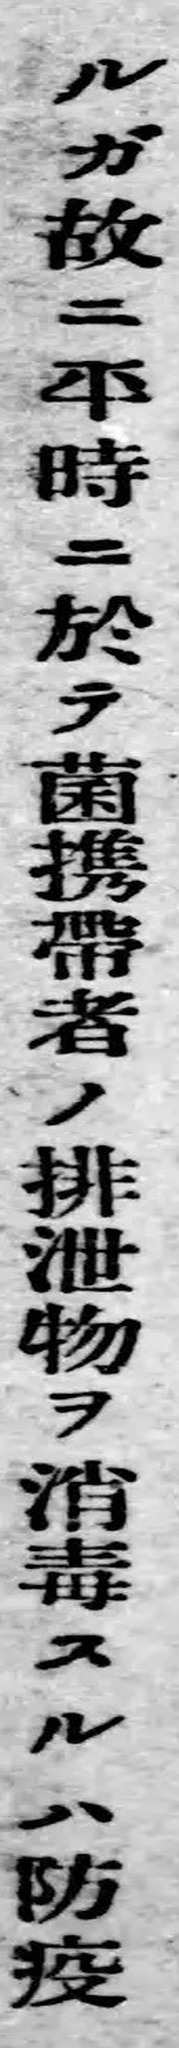ルガ故ニ平時ニ於テ菌携帶者ノ排泄物ヲ消毒スルハ防疫

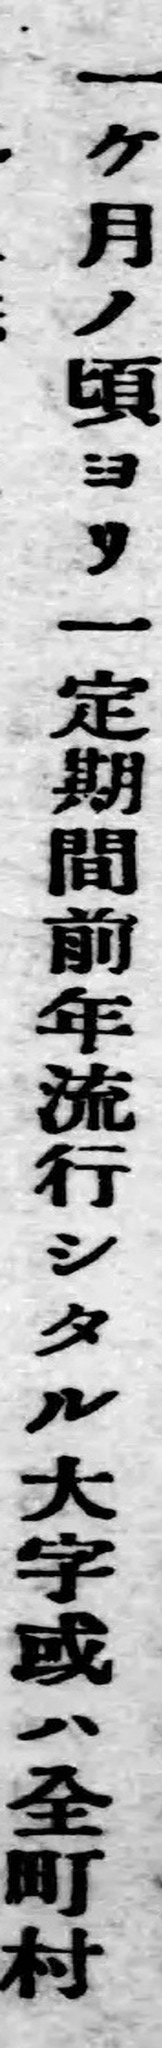一カ月ノ頃ヨリ一定期間前年流行シタル大字或ハ全町村
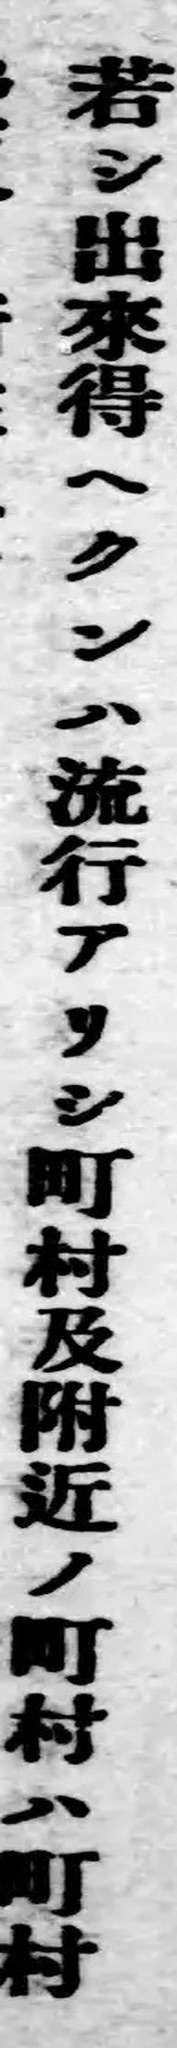若シ出來得ヘクンハ流行アリシ町村及附近ノ町村ハ町村
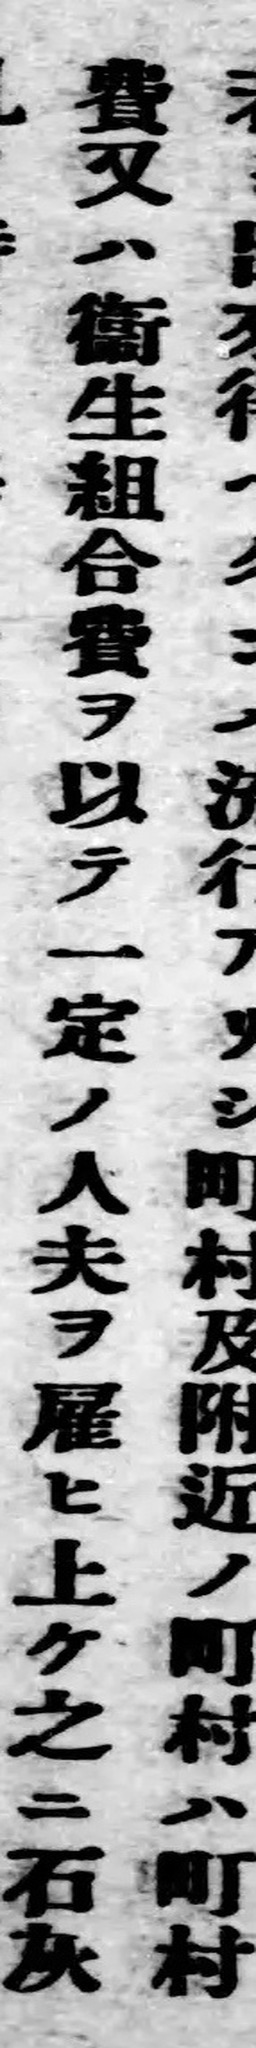費又ハ衛生組合費ヲ以テ一定ノ人夫ヲ雇ヒ上ケ之ニ石灰
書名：袖珍防疫必携
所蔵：国立国会図書館 National Diet Library, JAPAN
